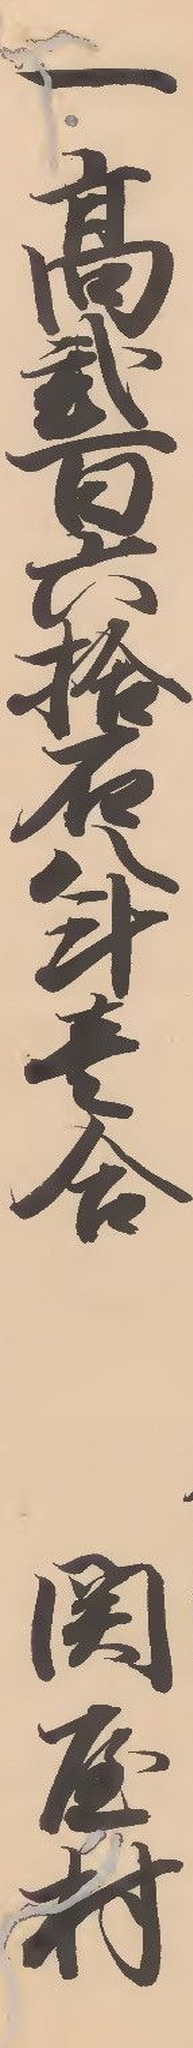一高弐百六拾石八斗壱合関屋村

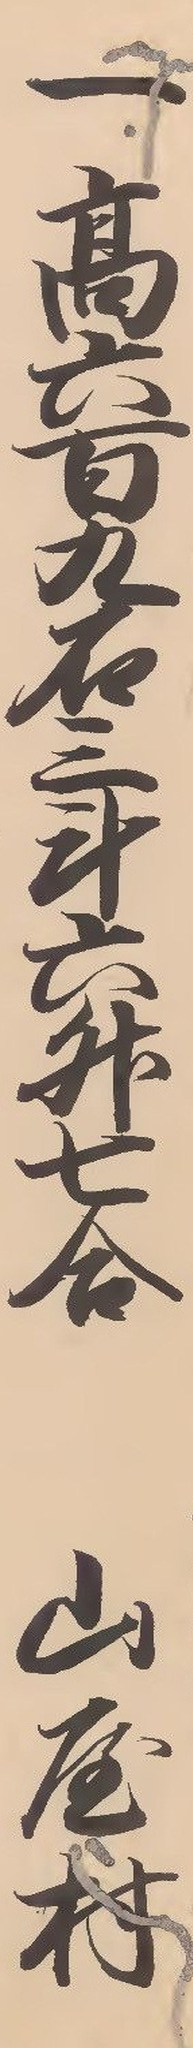一高六百九石三斗六升七合山屋村
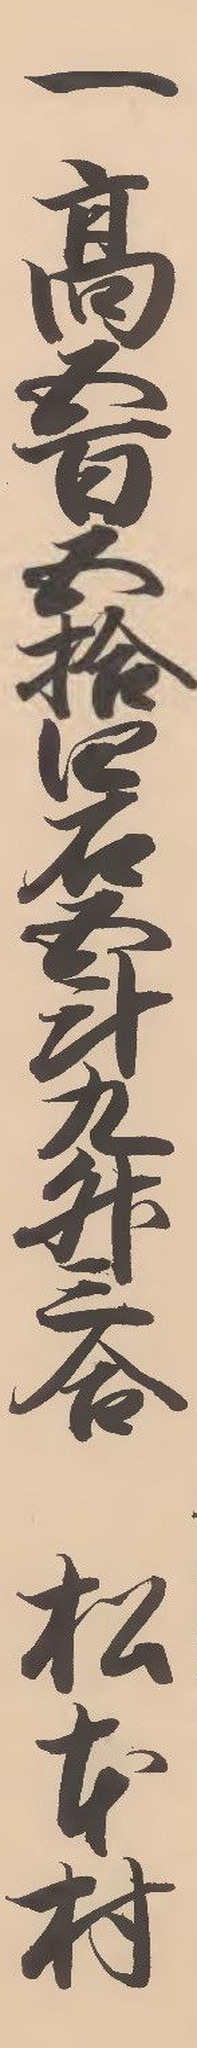一高五百五拾四石五斗九升三合松本村
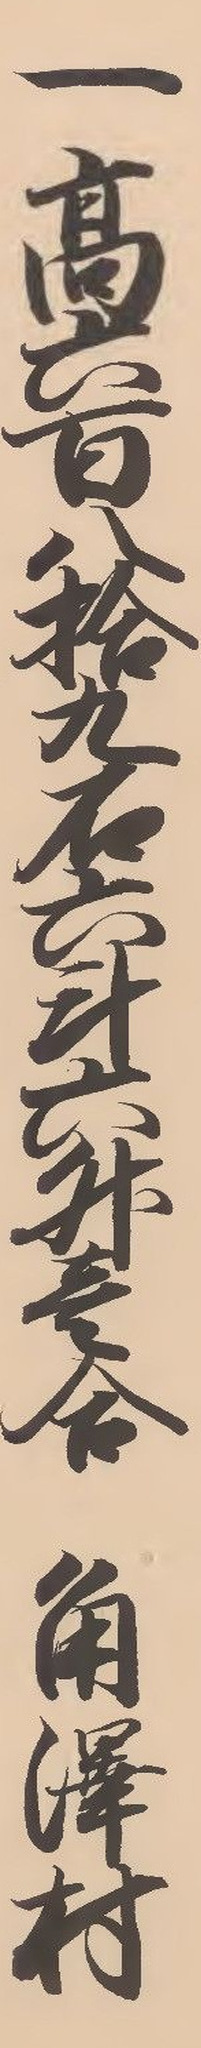一高六百八拾九石六斗壱合角沢村
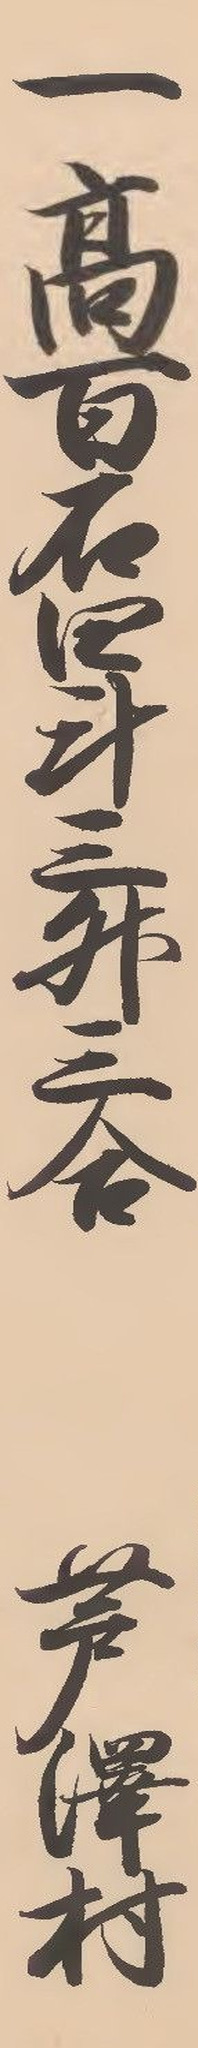一高百石四斗三升三合芦沢村
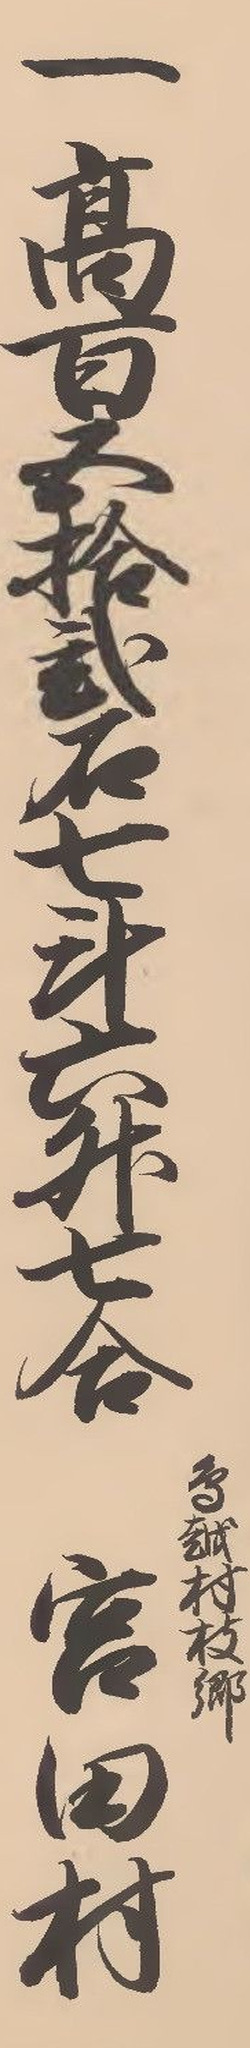一高百五拾弐石七斗六升七合宮田村
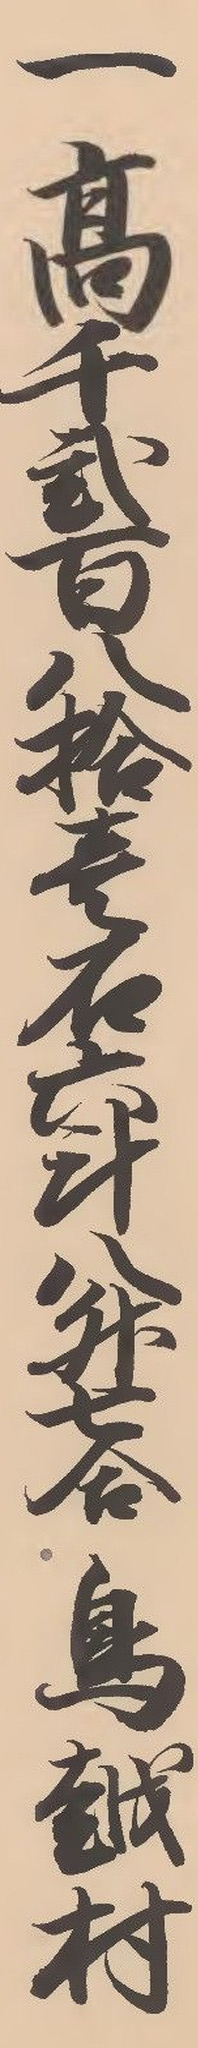一高千弐百八拾壱石六斗八升七合鳥越村
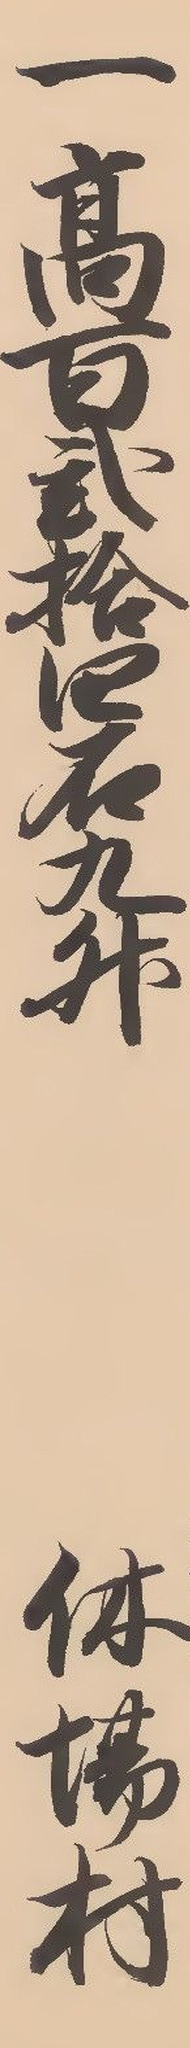一高百弐拾四石九升休場村
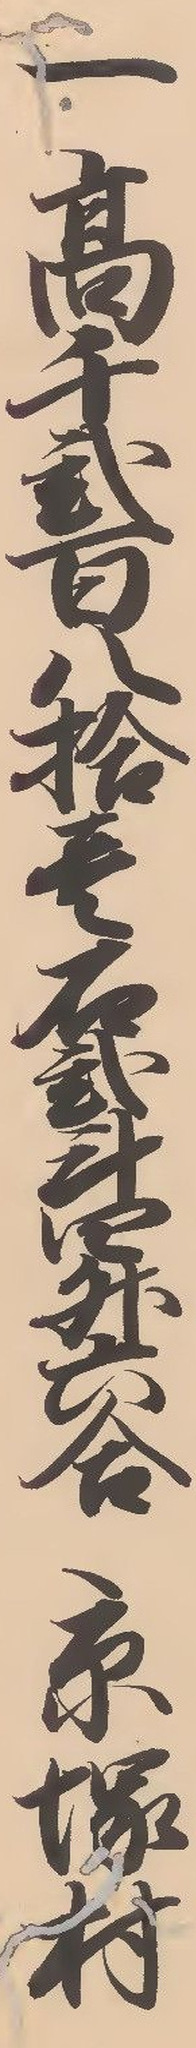一高千弐百八拾壱石弐斗四升六合京塚村

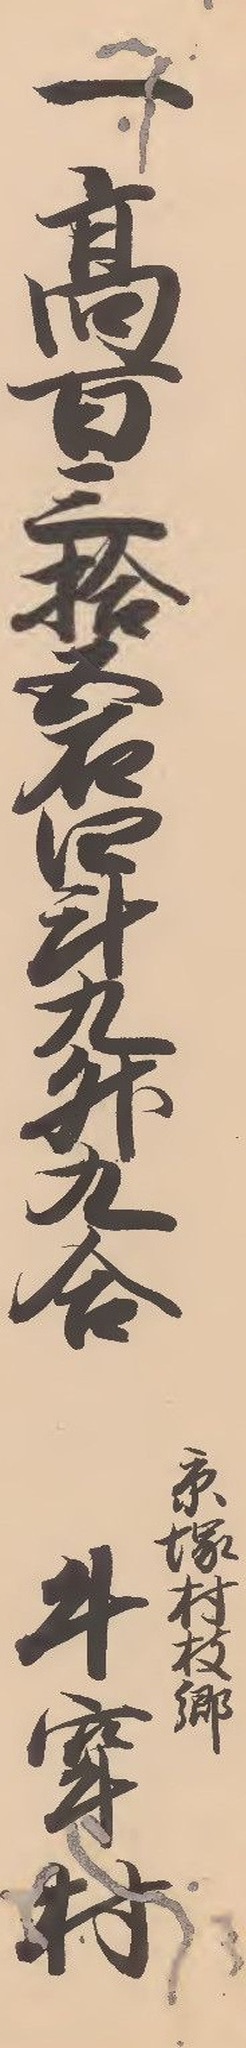一高百三拾五石四斗九升九合牛穿村
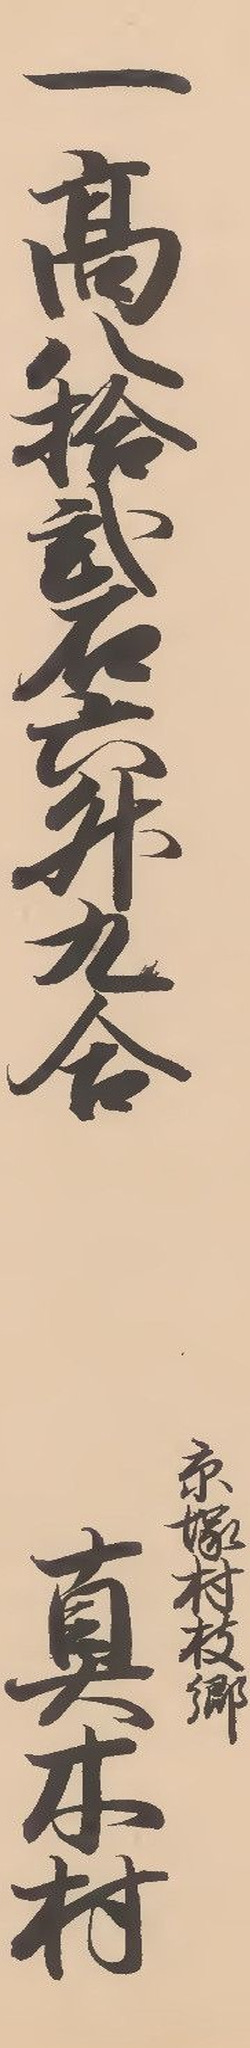一高八拾弐石六升九合真木村
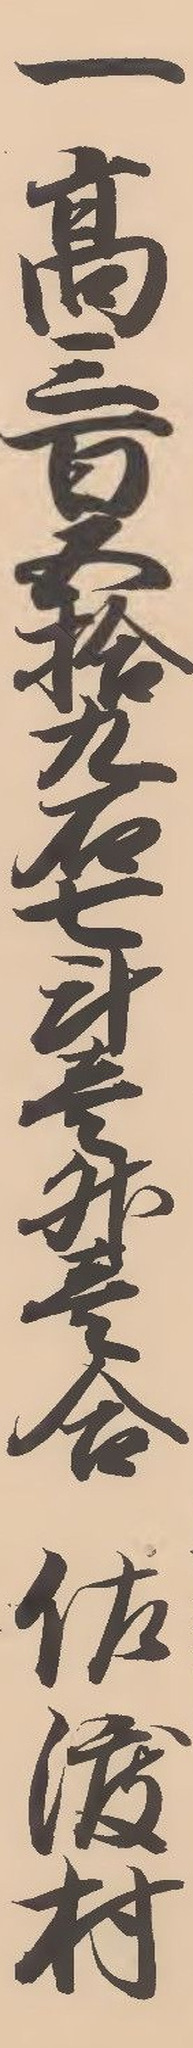一高三百五拾九石七斗壱升壱合佐渡村
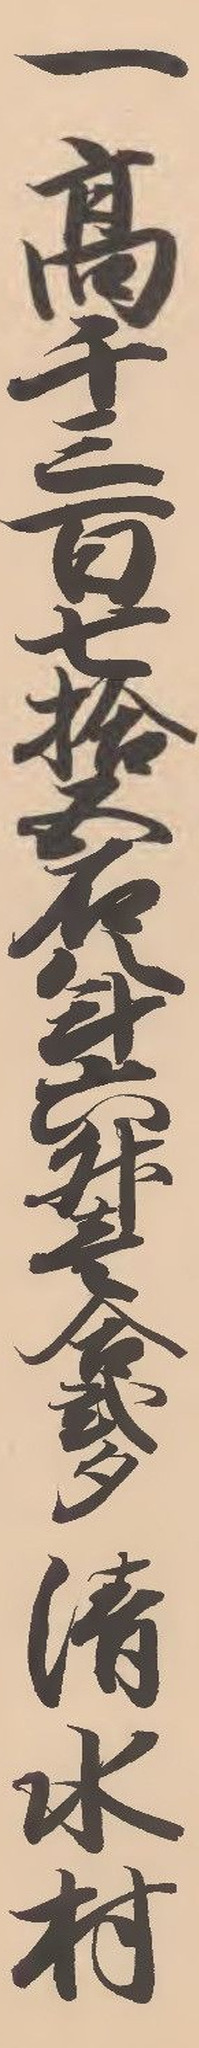一高千三百七拾五石八斗六升壱合弐勺清水村
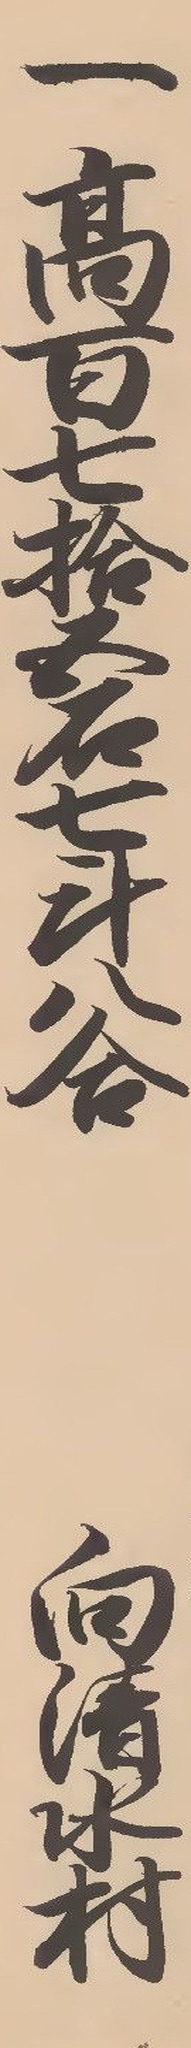一高百七拾五石七斗八合向清水村
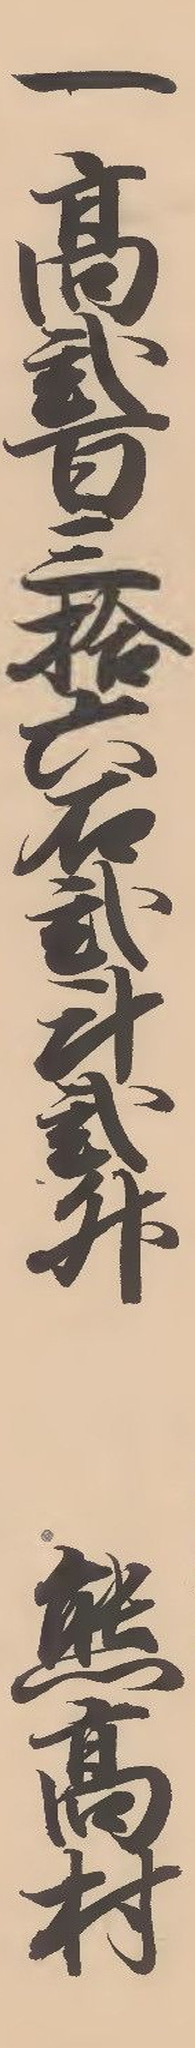一高弐百三拾六石弐斗弐升熊高村
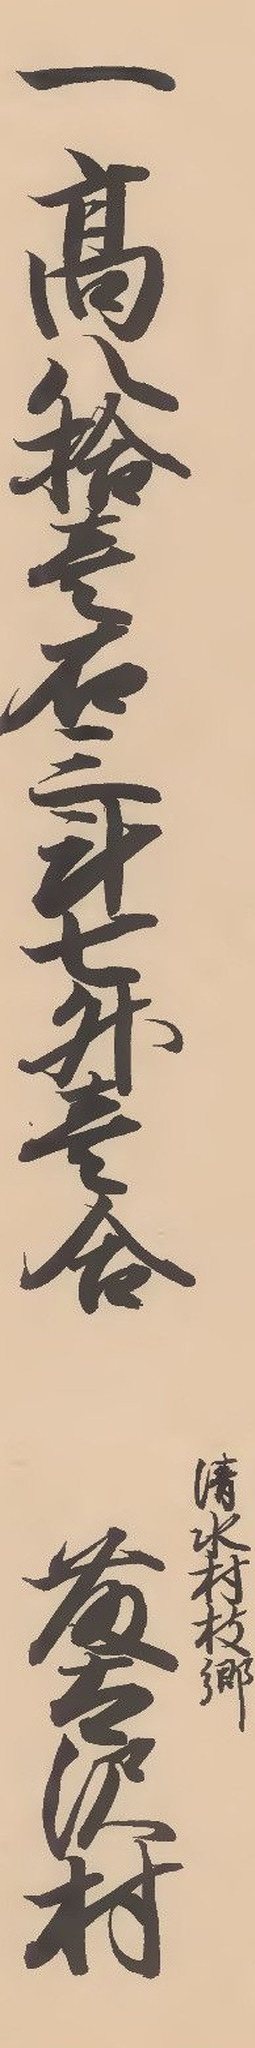一高八拾壱石三斗七升壱合藤太沢村
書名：出羽国郷帳　３
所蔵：国立公文書館 National Archives of Japan
